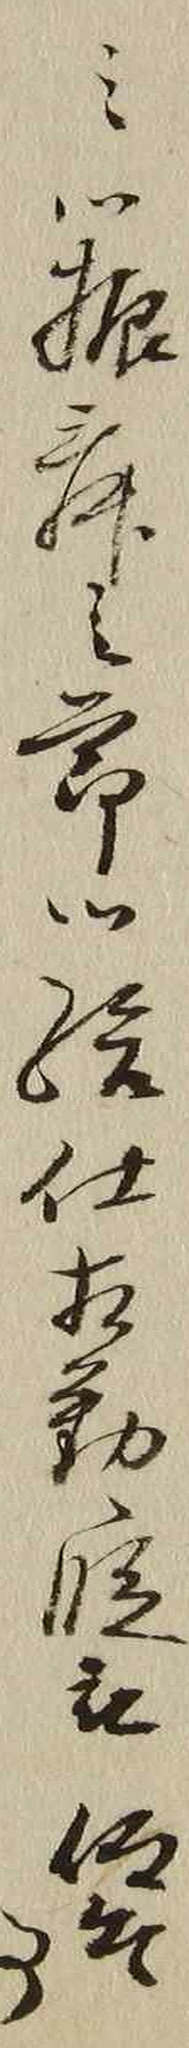之御振舞之節御給仕相勤候段被仰出候事
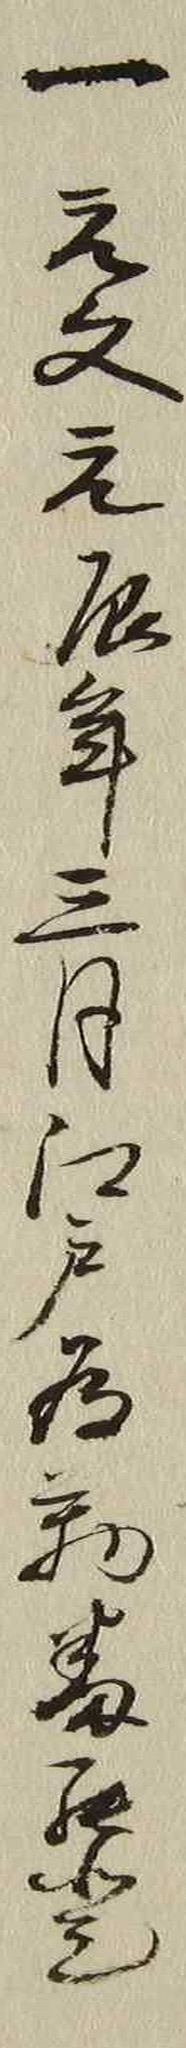一元文元辰年三月江戸為勤番罷登
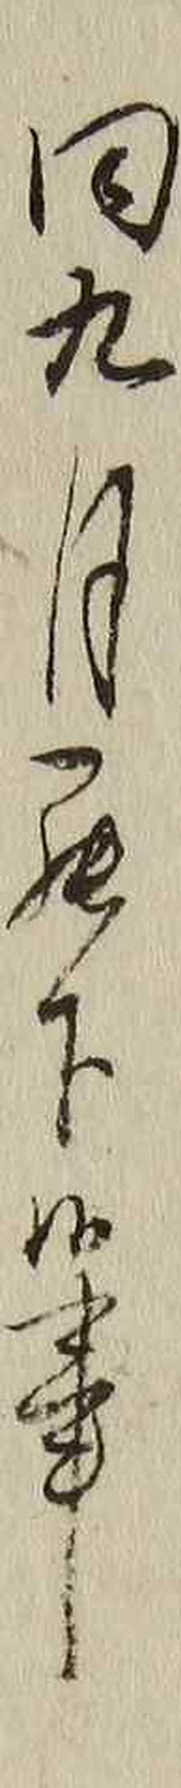同九月罷下候事
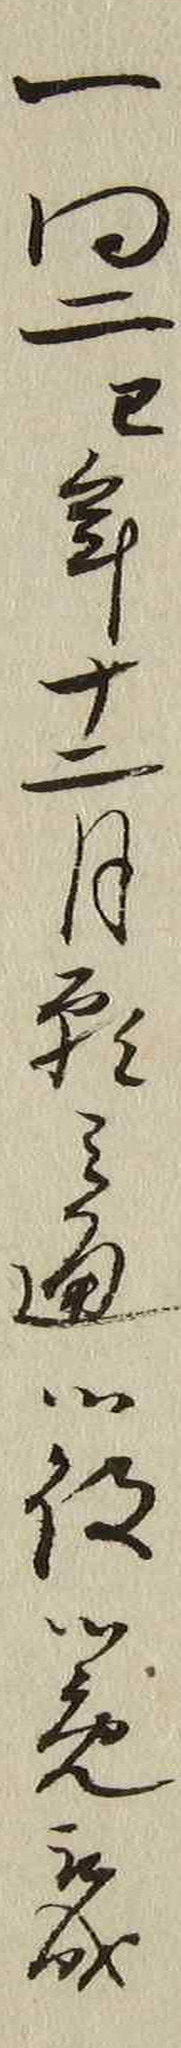一同二巳年十二月願之通御役御免被成
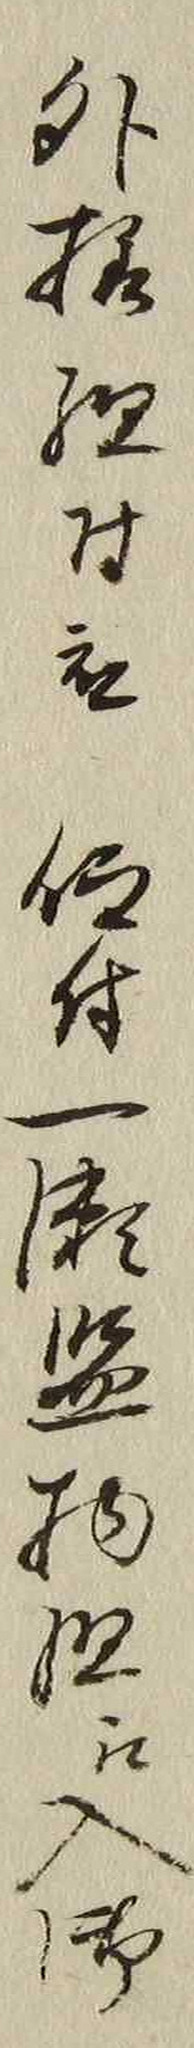外様組付被仰付一瀬監物組江入御
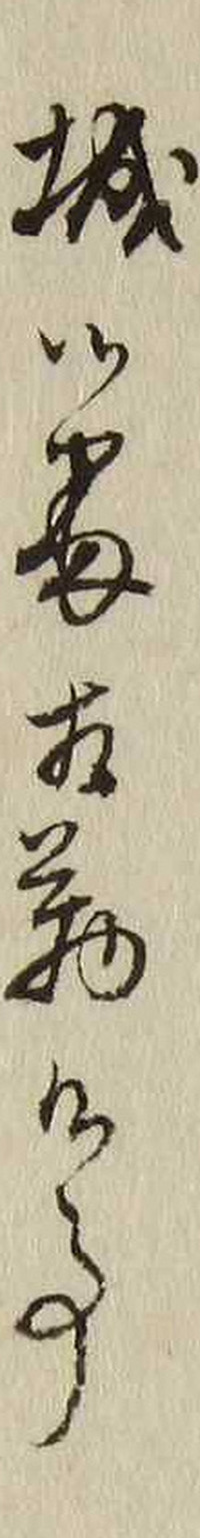城御番相勤候事
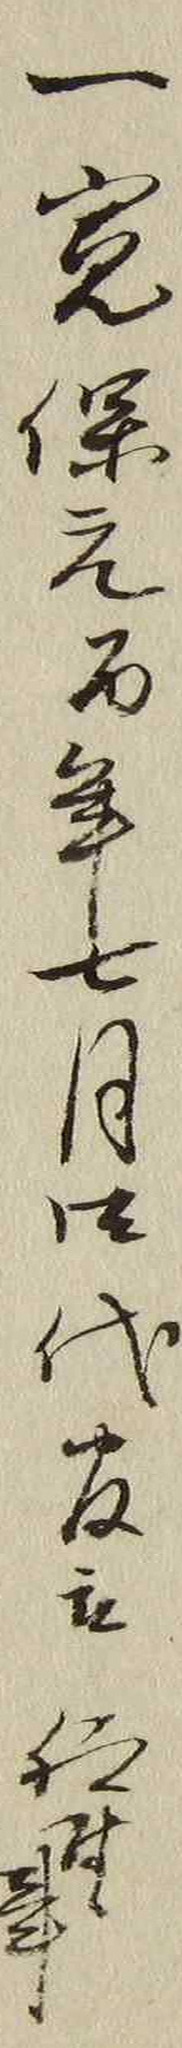一寛保元酉年七月御代官被仰付候事
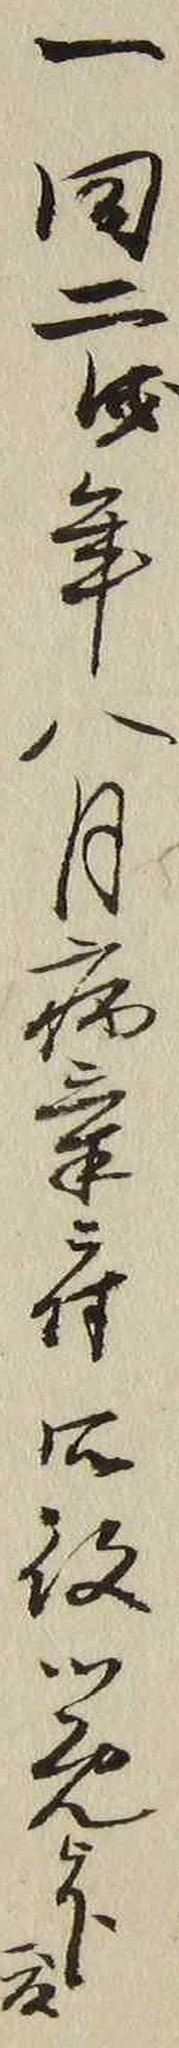一同二戌年八月病気ニ付御役御免被下度
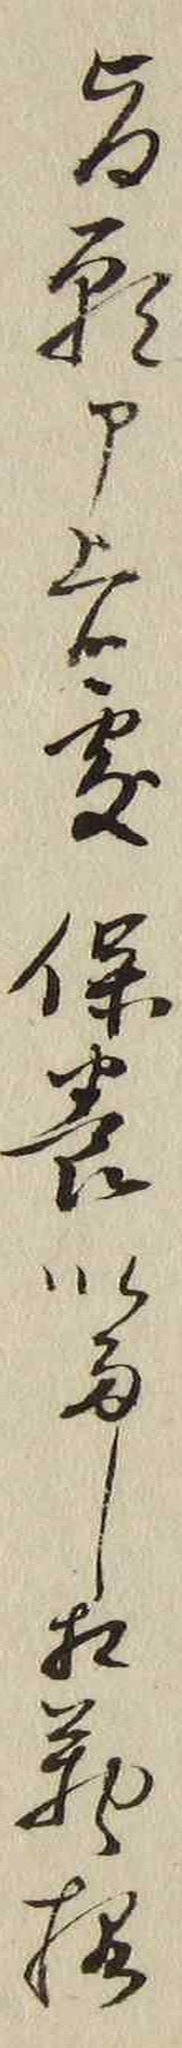旨願申上候処保養いたし相勤候様
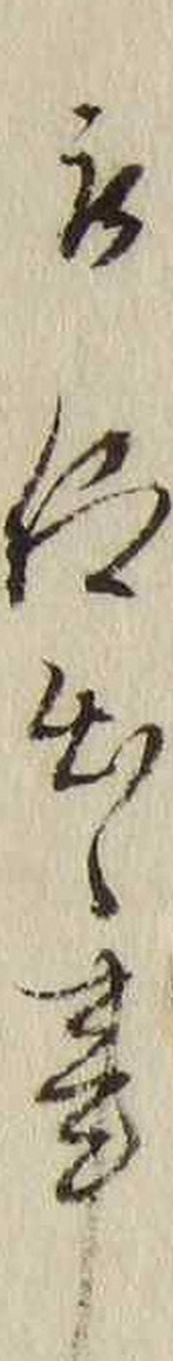被仰出候事
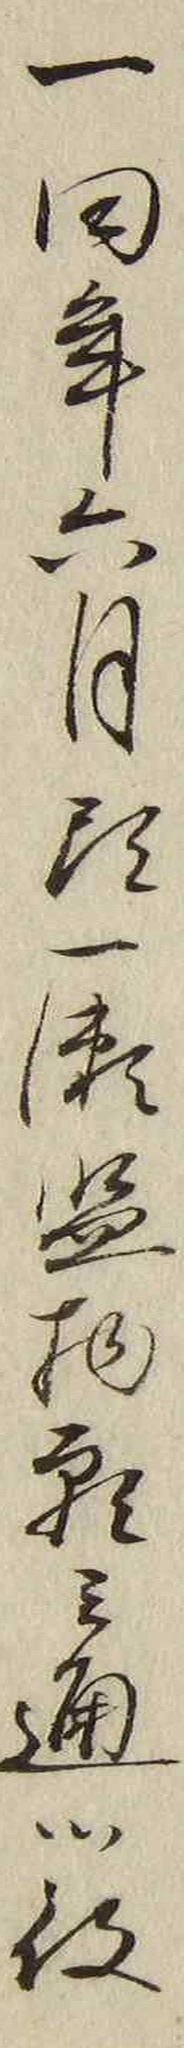一同年六月頭一瀬監物願之通御役

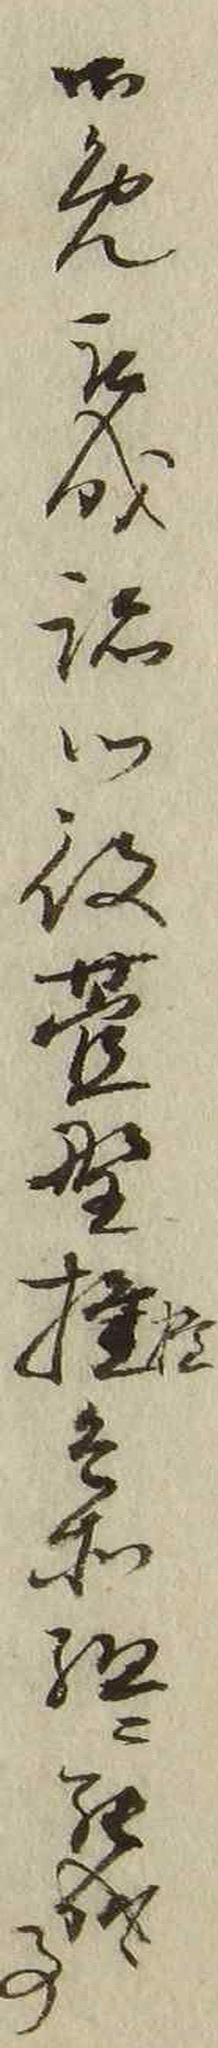御免被成跡御役菅野権兵衛組ニ罷成候事
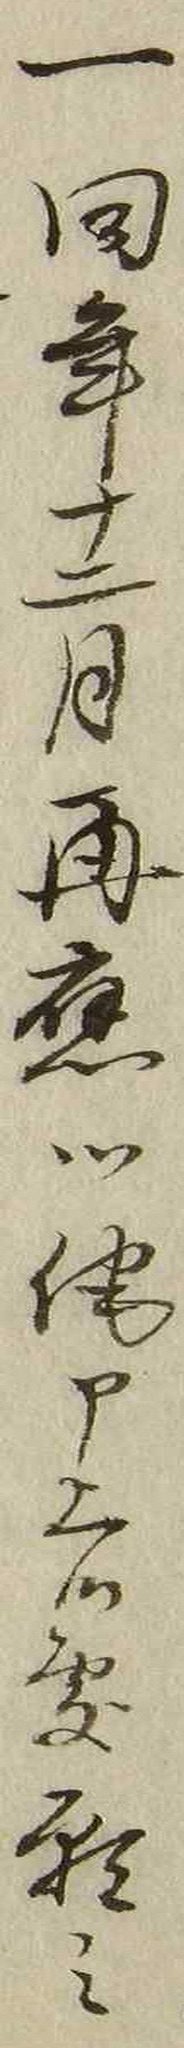一同年十二月再応御侘申上候処願之
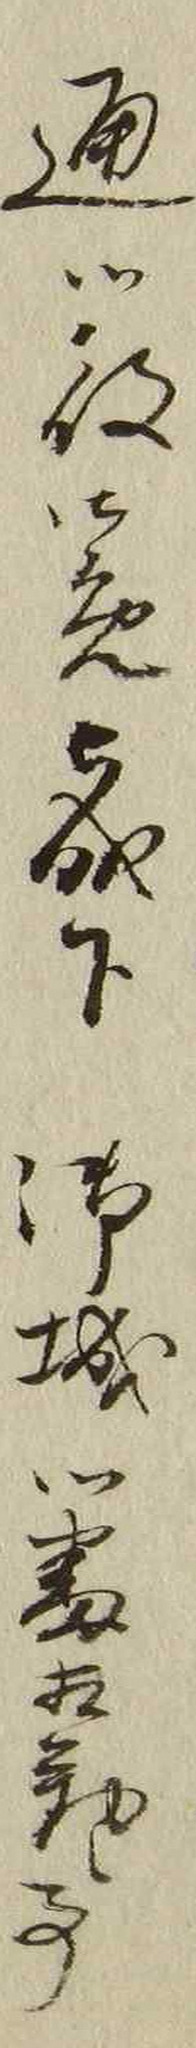通御役御免被成下御城御番相勤候事
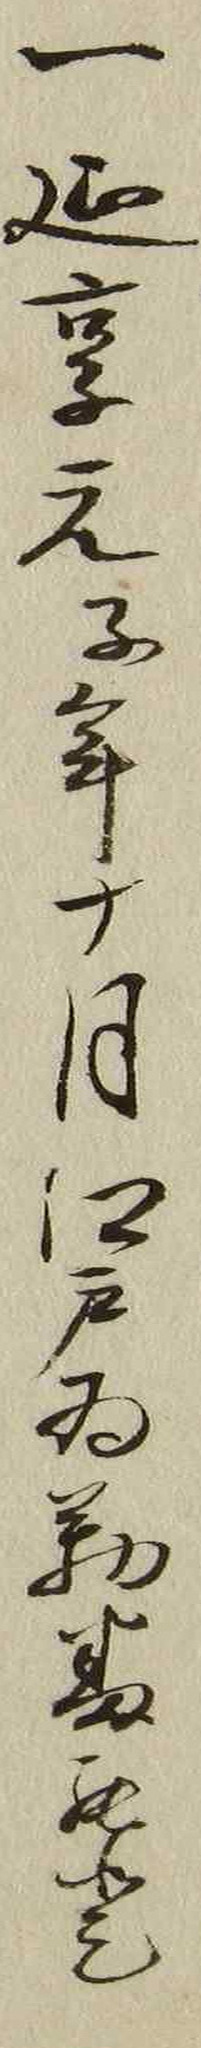一延享元子年十月江戸為勤番罷登
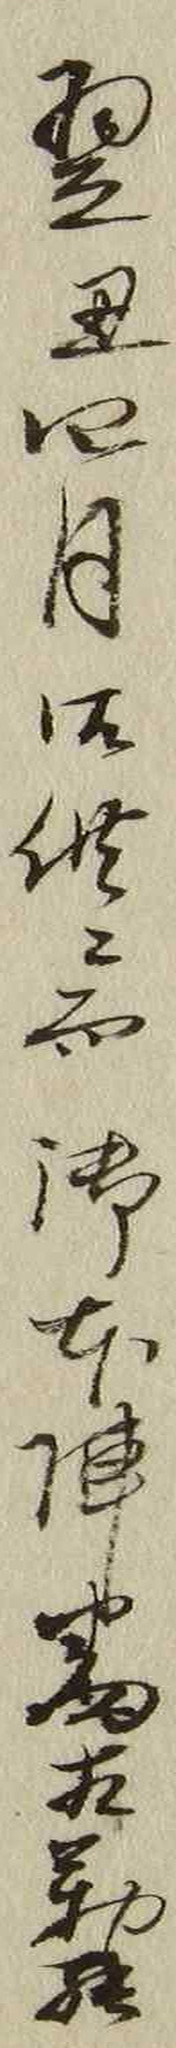翌丑四月御供ニ而御本陣番相勤罷
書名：諸士系譜　巻之359　す之部9
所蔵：会津若松市立会津図書館
